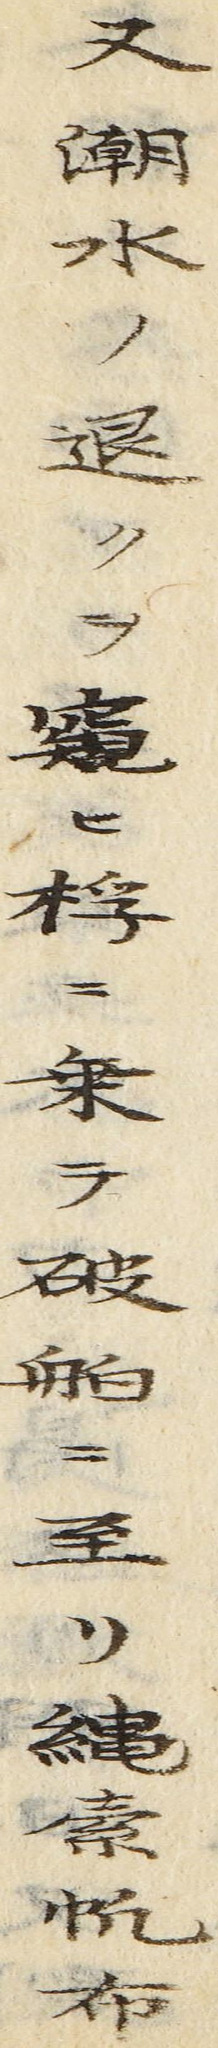又潮水ノ退クヲ窺ヒ桴ニ乗テ破舶ニ至リ縄索帆布
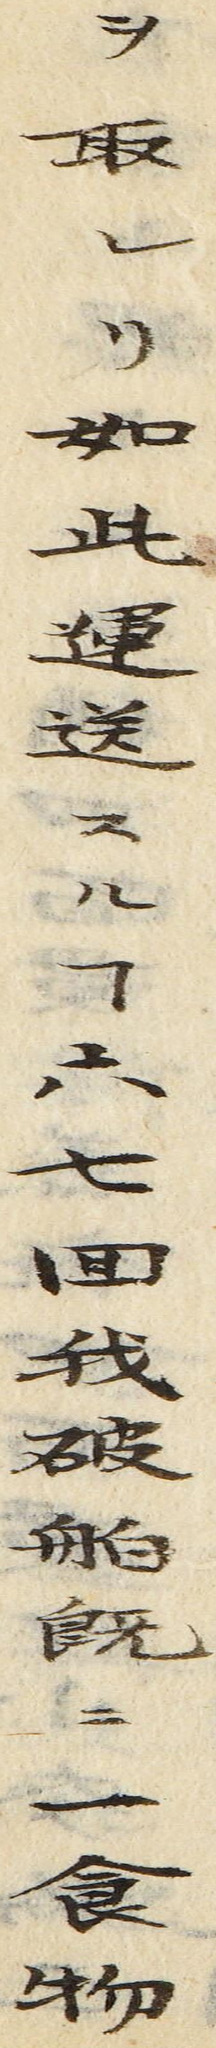ヲ取レリ如此運送スルコト六七回我破舶既ニ一食物

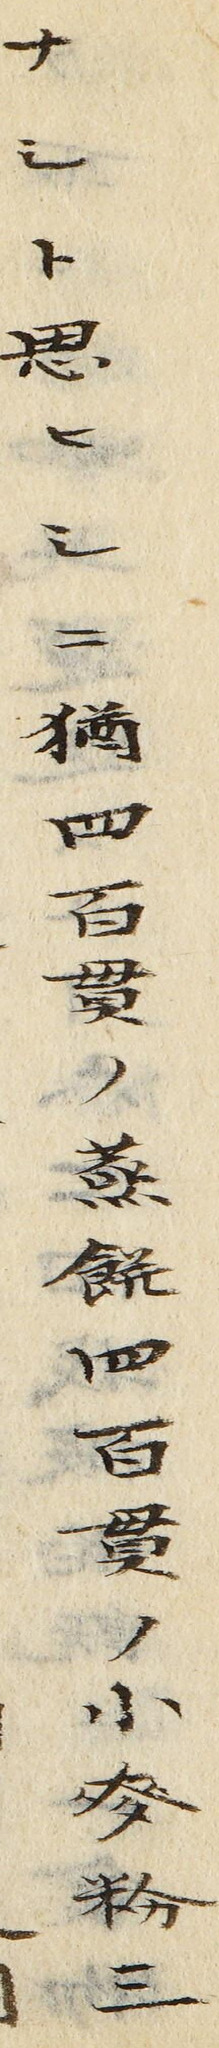ナレト思ヒシニ猶四百貫ノ蒸餅四百貫ノ小麦粉三
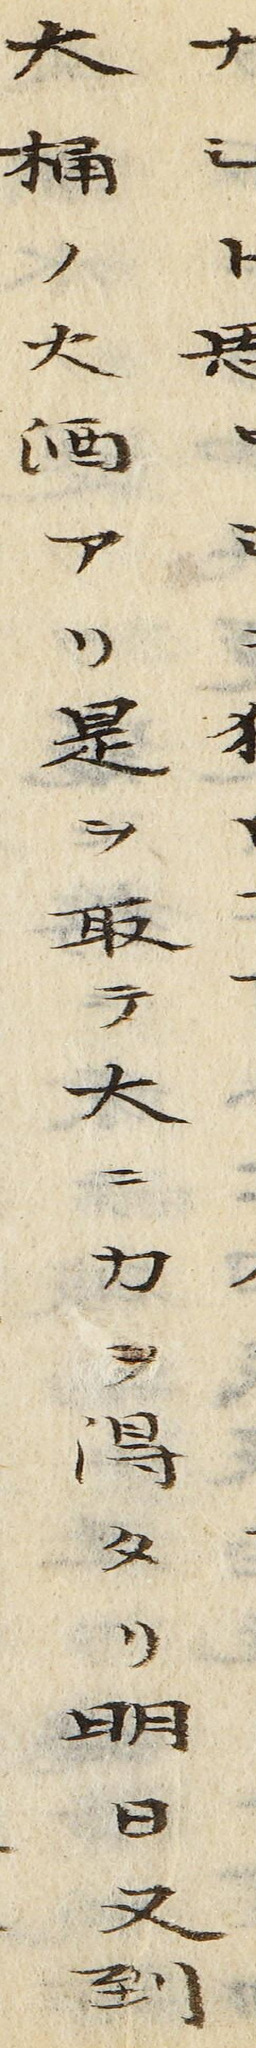大桶ノ火酒アリ是ヲ取テ大ニ力ヲ得タリ明日又到
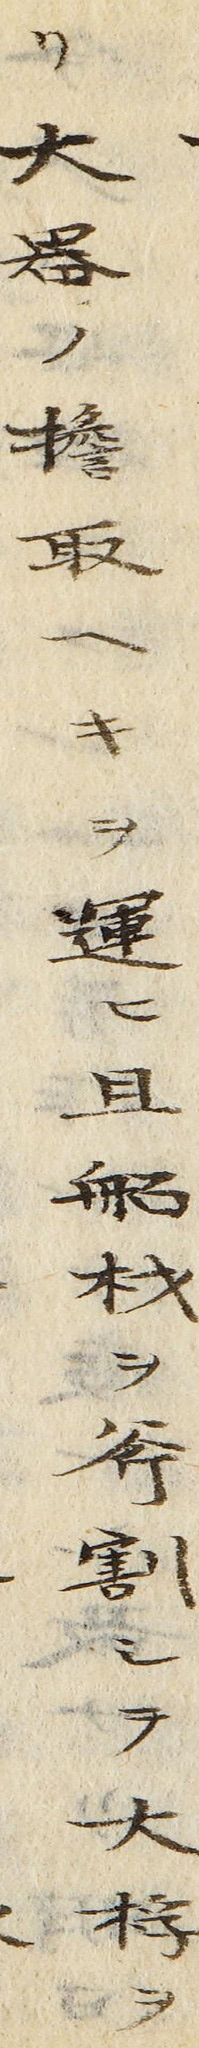リ大器ノ擔取ヘキヲ運ヒ且船材ヲ斧割シテ大桴ヲ
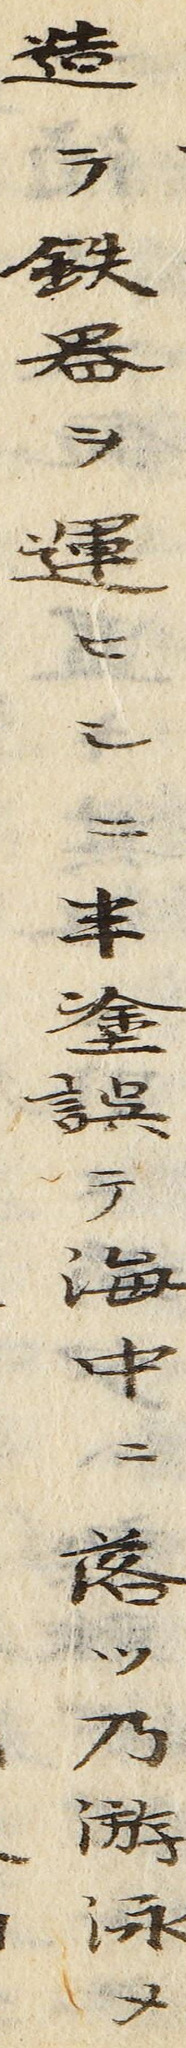造テ鉄器ヲ運ヒシニ半塗誤テ海中ニ落ツ乃游泳シテ
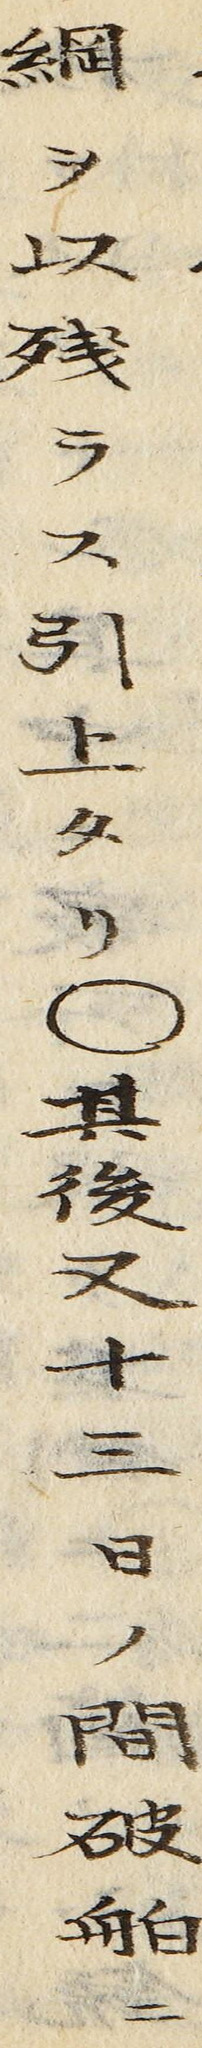綱ヲ以残ラス引上タリ◯其後又十三日ノ間破舶ニ
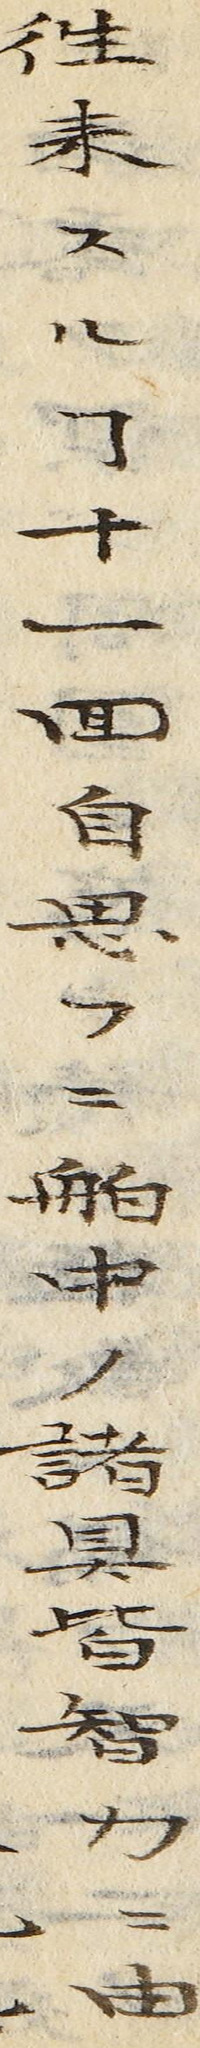往来スルコト十一回自思フニ舶中ノ諸具皆智力ニ由
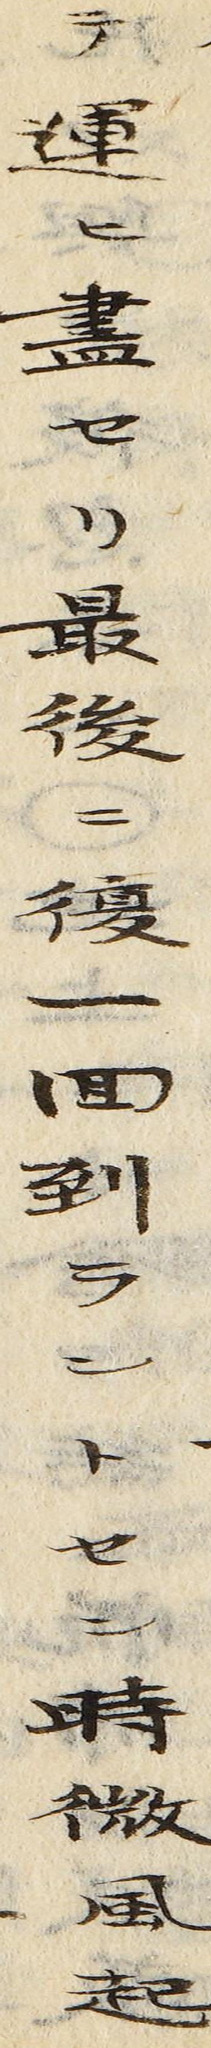テ運ヒ尽セリ最後ニ復一回到ラントセン時微風起
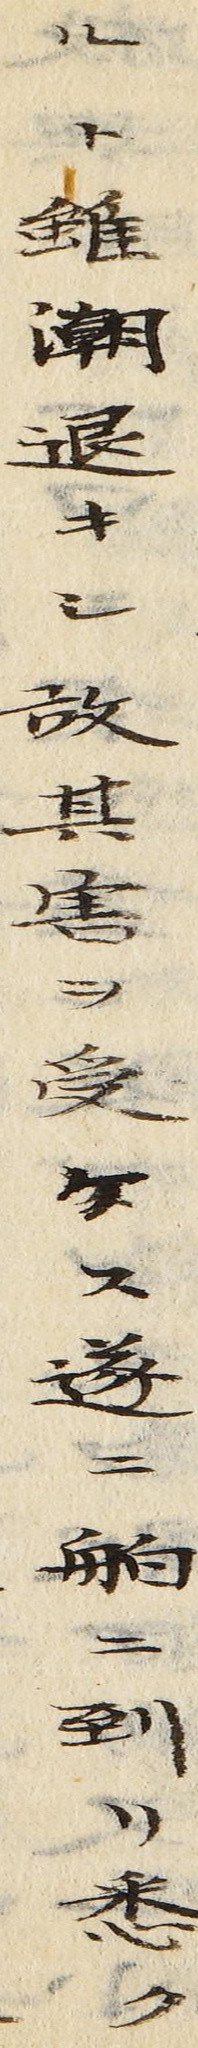ルト雖潮退キシ故其害ヲ受ケス遂ニ舶ニ到リ悉ク
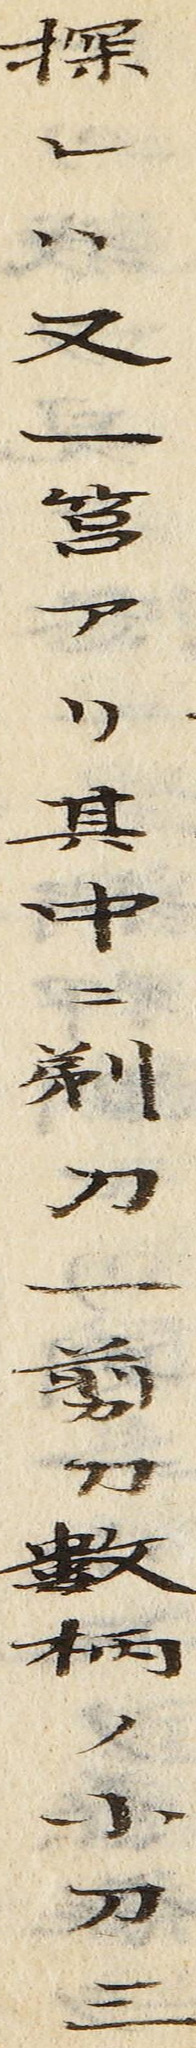探レハ又一筥アリ其中ニ剃刀一剪刀数柄ノ小刀三
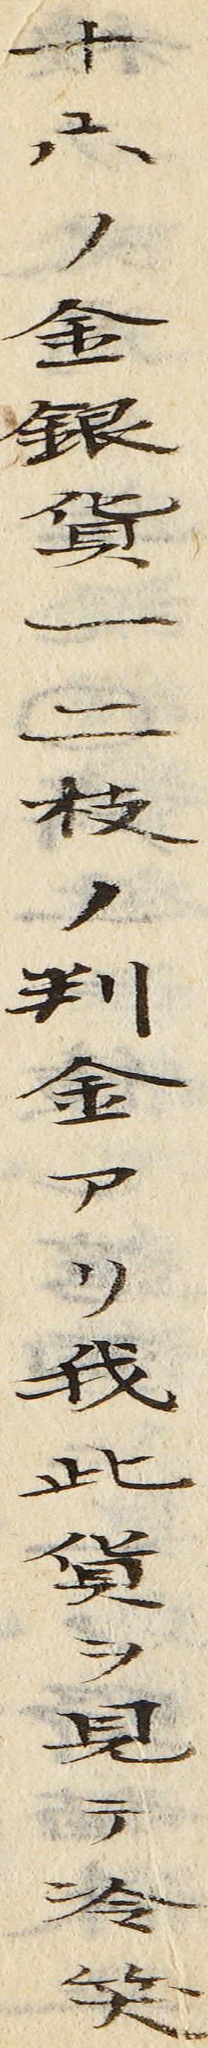十六ノ金銀貨一二枝ノ判金アリ我此貨ヲ見テ冷笑
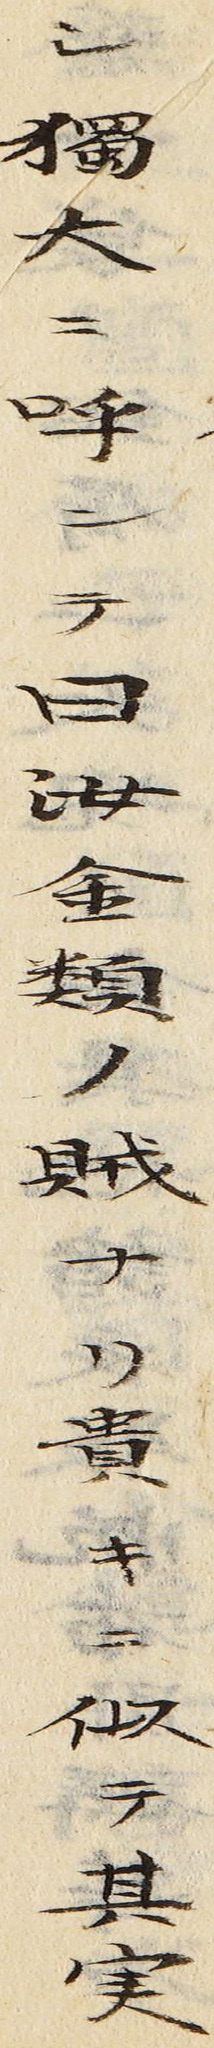シ独大ニ呼ンテ曰汝金類ノ賊ナリ貴キニ似テ其実
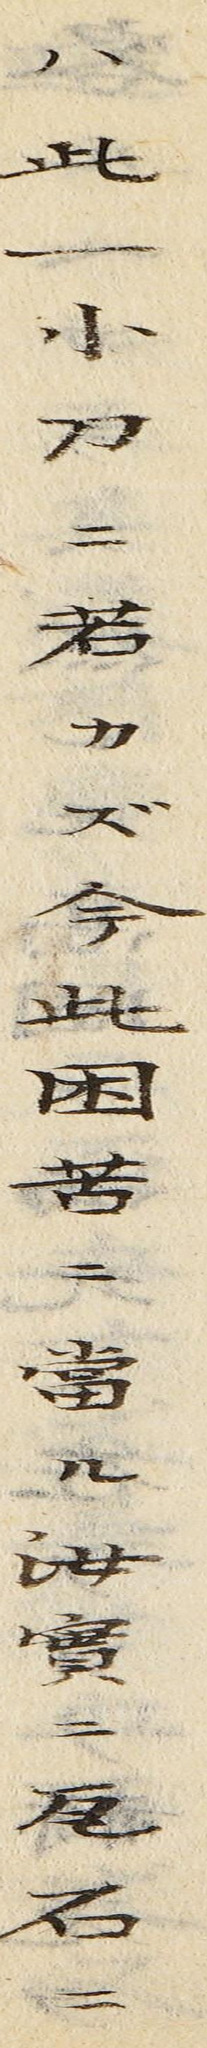ハ此一小刀ニ若カズ今此困苦ニ当ル汝実ニ瓦石ニ
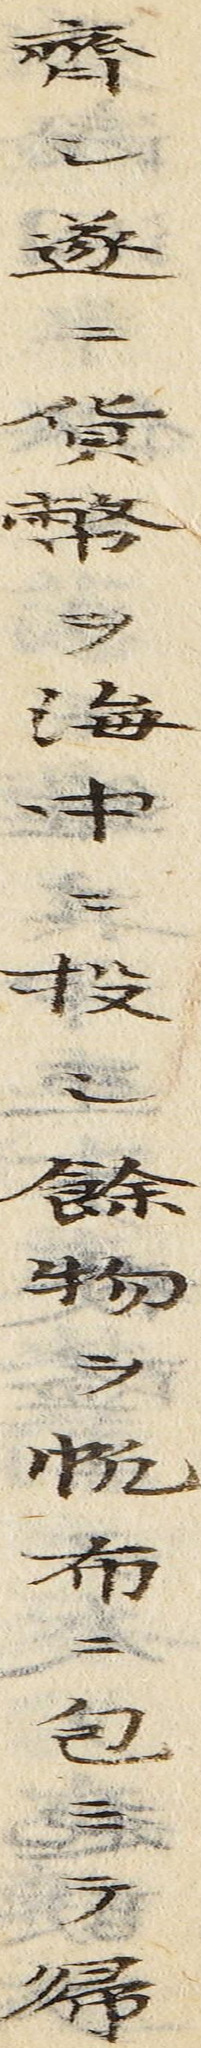斉シ遂ニ貨幣ヲ海中ニ投シ余物ヲ帆布ニ包ミテ帰
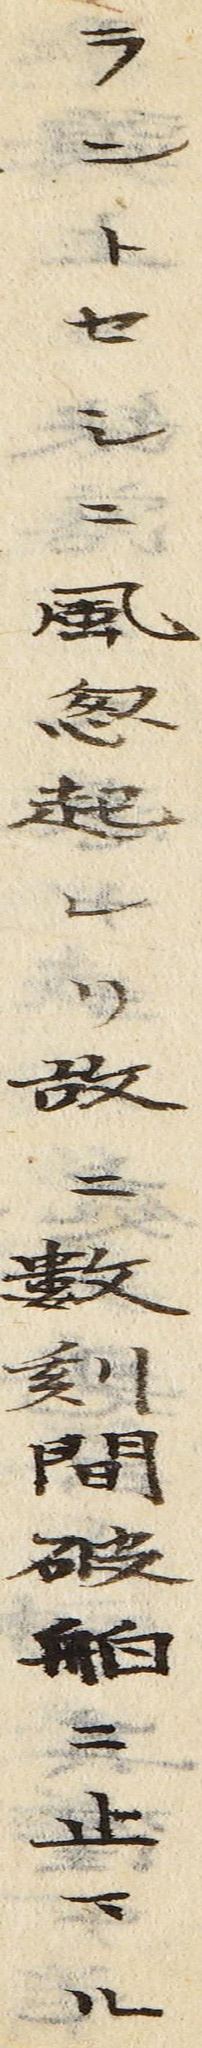ラントセシニ風忽起レリ故ニ数刻間破舶ニ止マル
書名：漂流紀事
